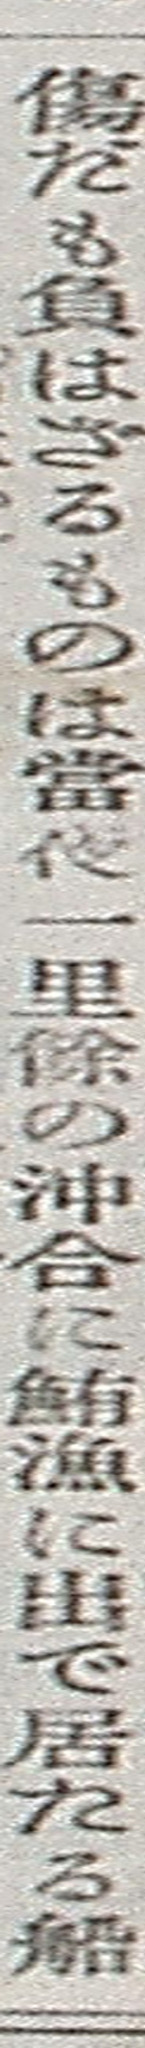傷だも負はざるものは当夜一里余の沖合に鮪漁に出で居たる船
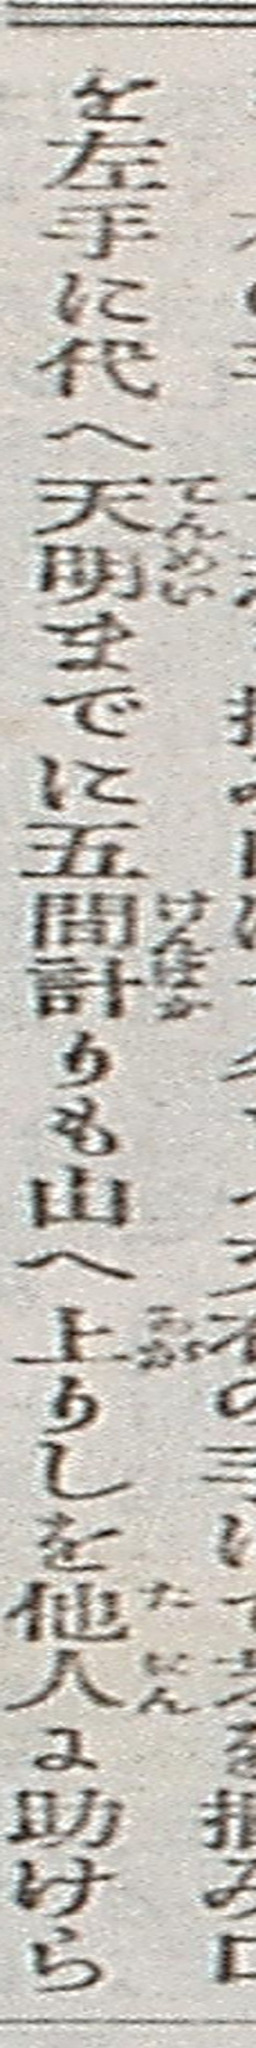を左手に代へ天明までに五間計りも山へ上りしを他人に助けら
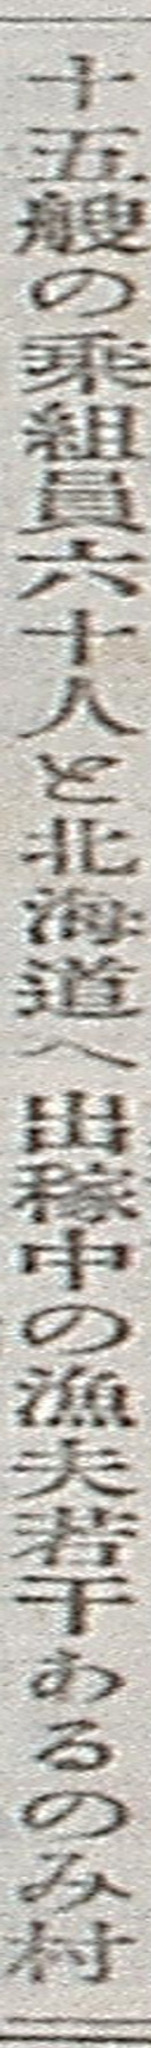十五艘の乗組員六十人と北海道へ出稼中の漁夫若干あるのみ村
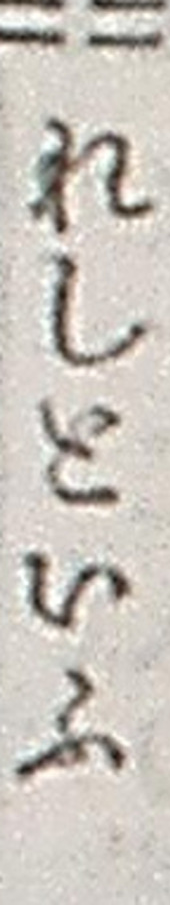れしといふ
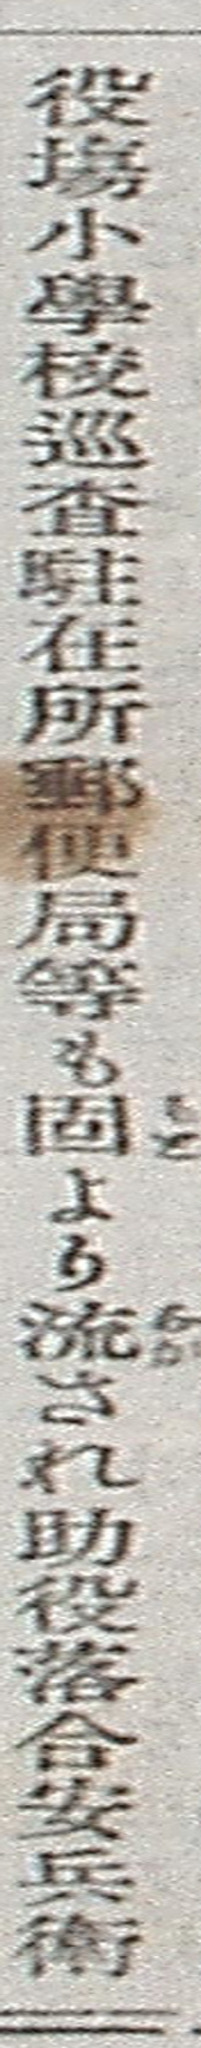役場小学校巡査駐在所郵便局等も固より流され助役落合安兵衛

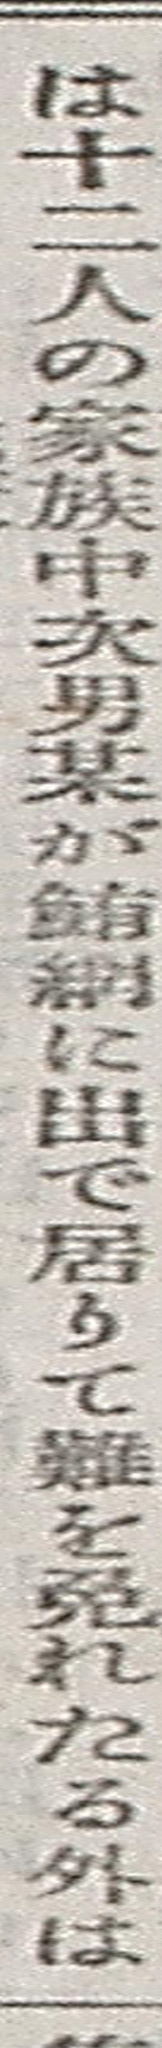は十二人の家族中次男某が鮪網に出で居りて難を免れたる外は
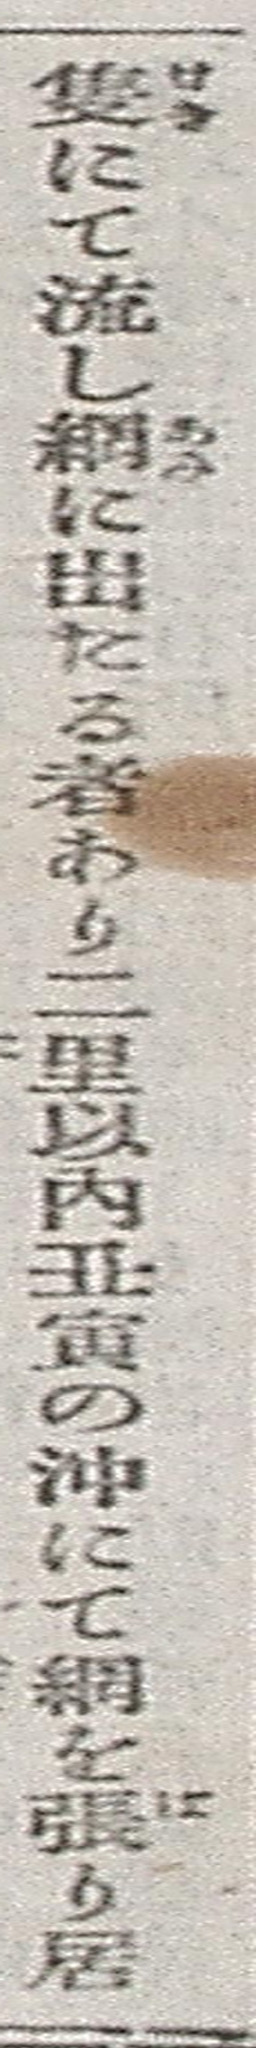隻にて流し網に出たる者あり二里以丑寅の沖にて網を張り居
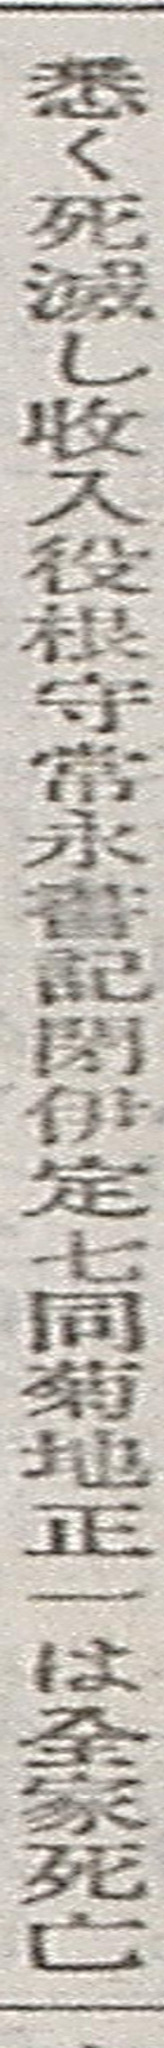悉く死滅し収入役根守常永書記閉伊定七同菊地正一は全家死亡
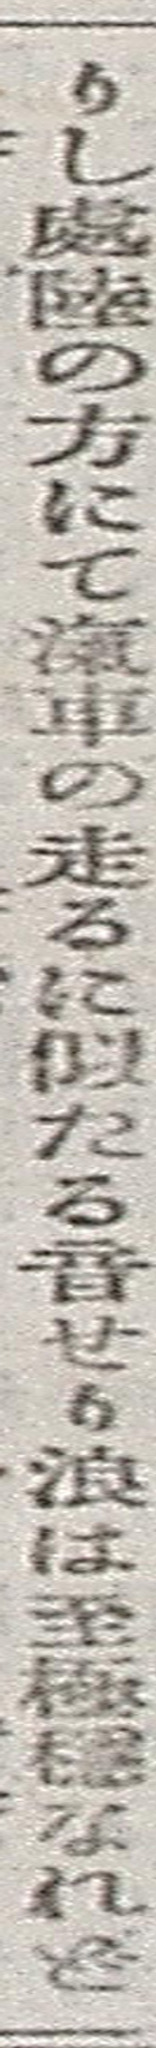りし処陸の方にて汽車の走るに似たる音せり浪は至極穏なれど
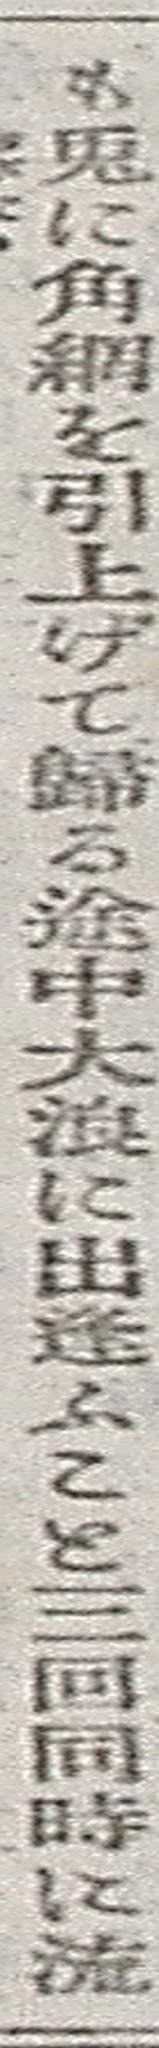も兎に角網を引上げて帰る途中大浪に出逢ふこと三回同時に流
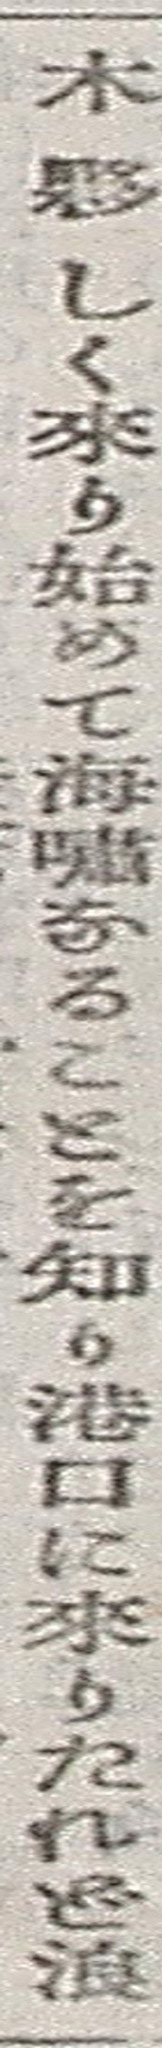木夥しく来り始めて海嘯なることを知り港口に来りたれど浪
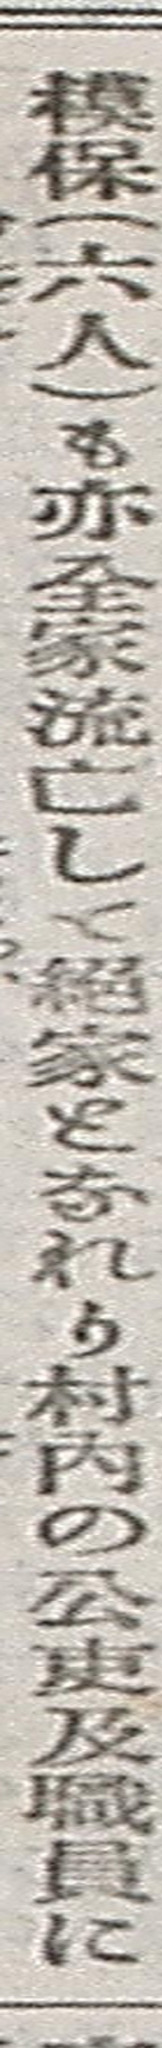模保も亦全家流亡して絶家となれり村内の公吏及職員に
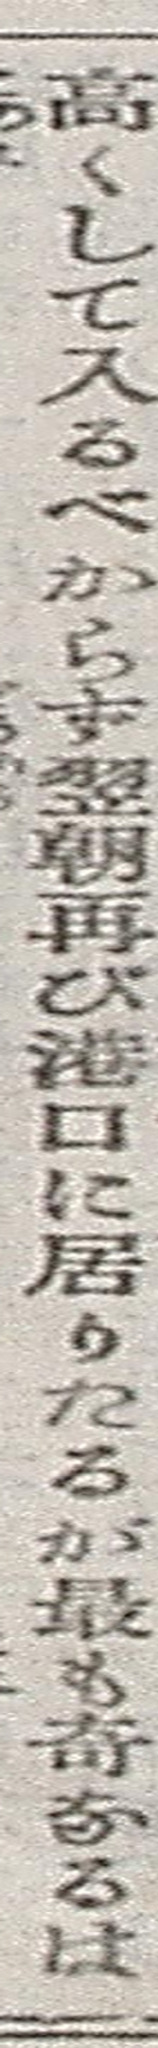高くして入るべからず翌朝再び港口に居りたるが最も奇なるは
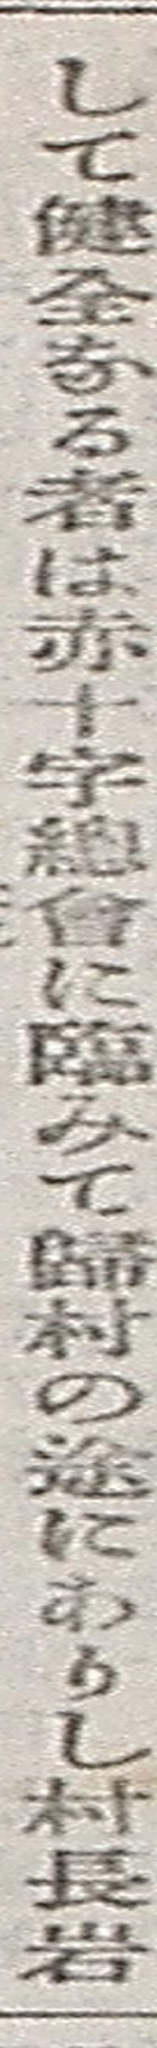して健全なる者は赤十字総会に臨みて帰村の途にありし村長岩
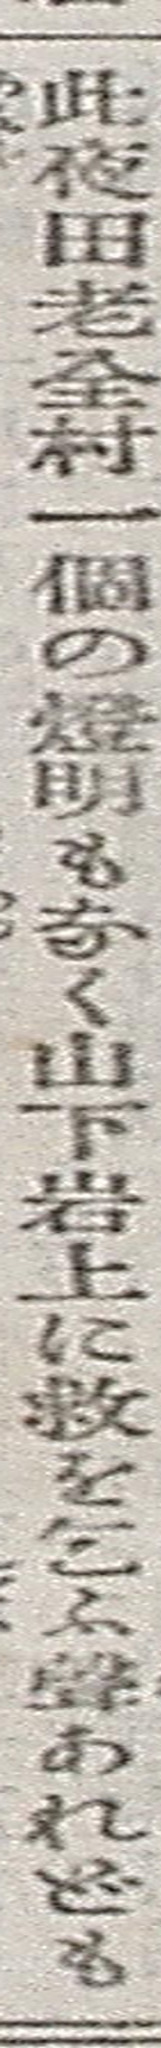此夜田老全村一個の灯明もなく山下岩上に救を乞ふ声あれども
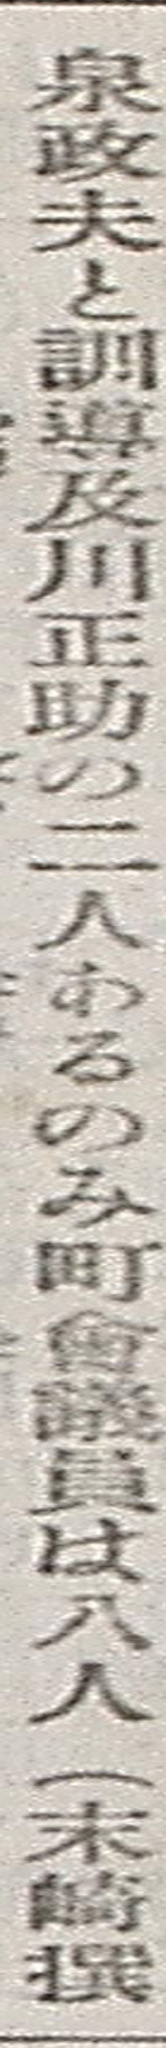泉政夫と訓導及川正助の二人あるのみ町会議員は八人（末崎撰
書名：風俗畫報臨時増刊第百二十號　大海嘯被害録（下）
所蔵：東京大学地震研究所図書室 Earthquake Research Institute Library, The University of Tokyo, JAPAN
